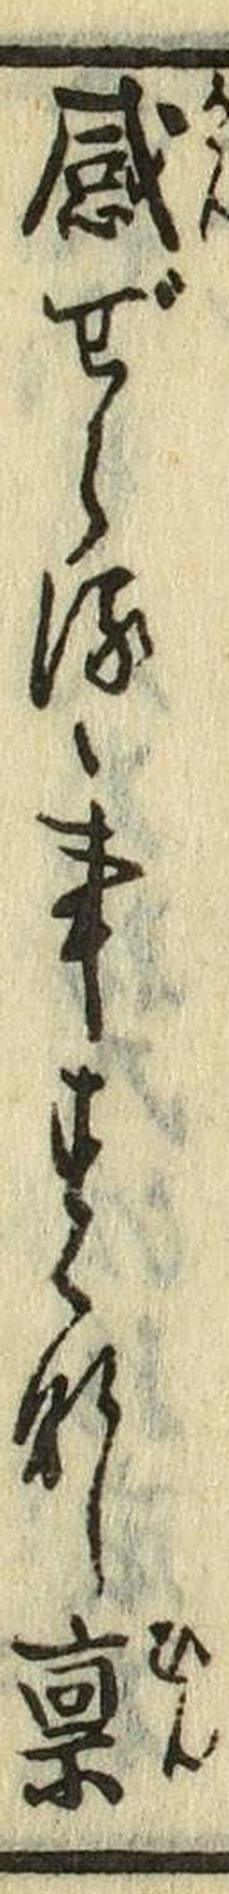感ぜらるゝ事すくなし稟
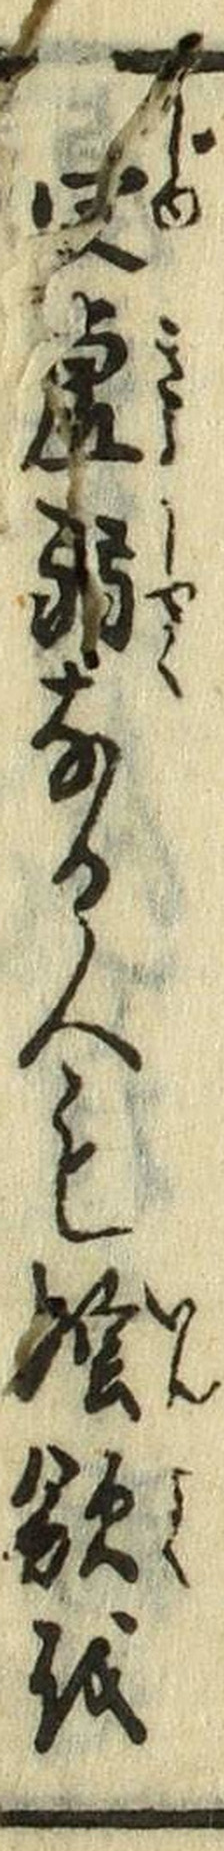受虚弱なる人も婬欲を
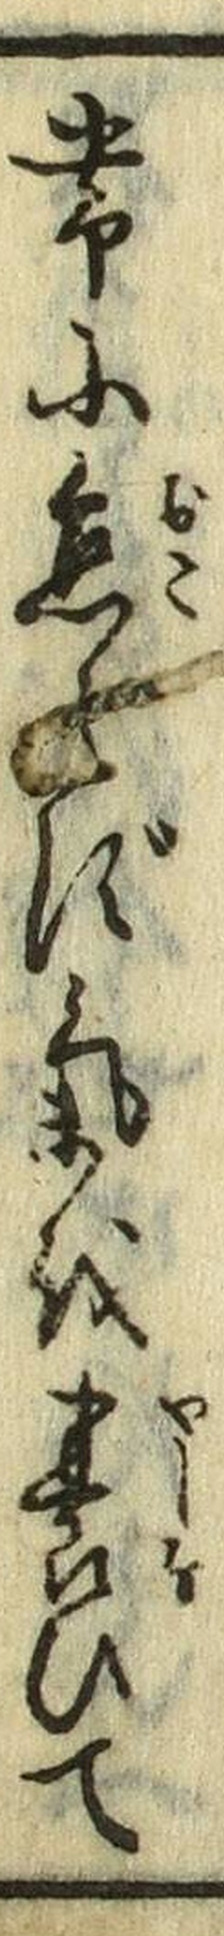常に怠らず気を養ひて
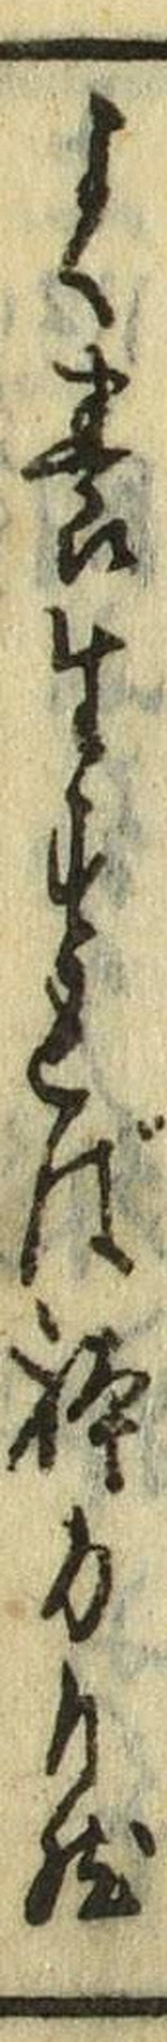よく養生すれば体力自然

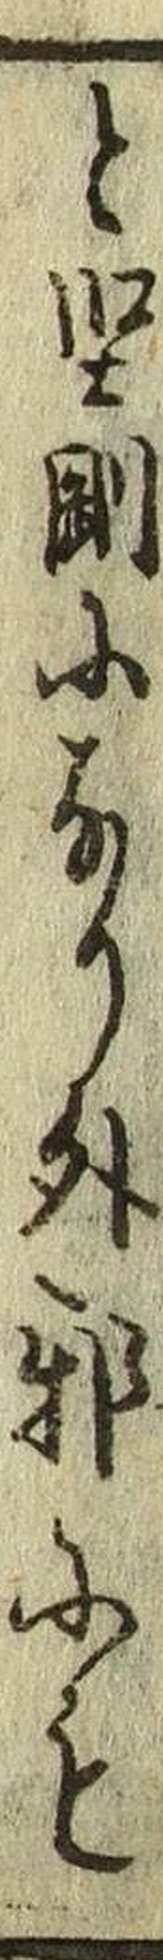と堅剛になり外邪にも
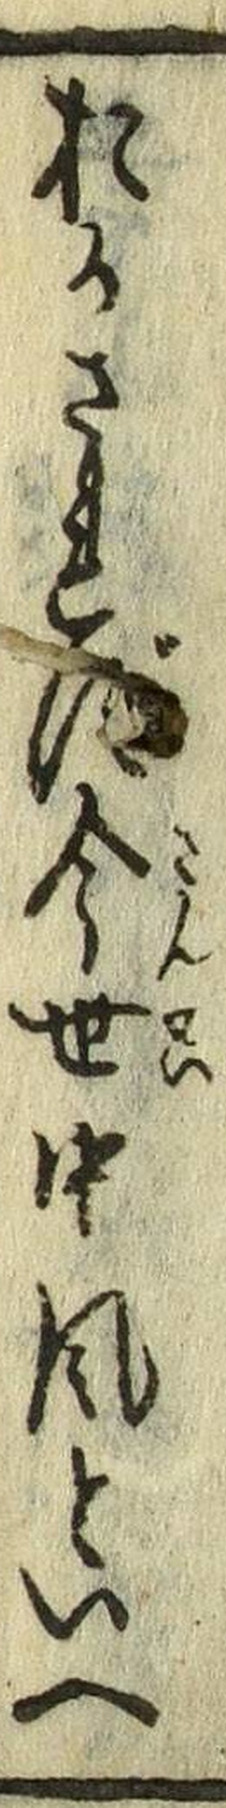おかされず今世中風といへ
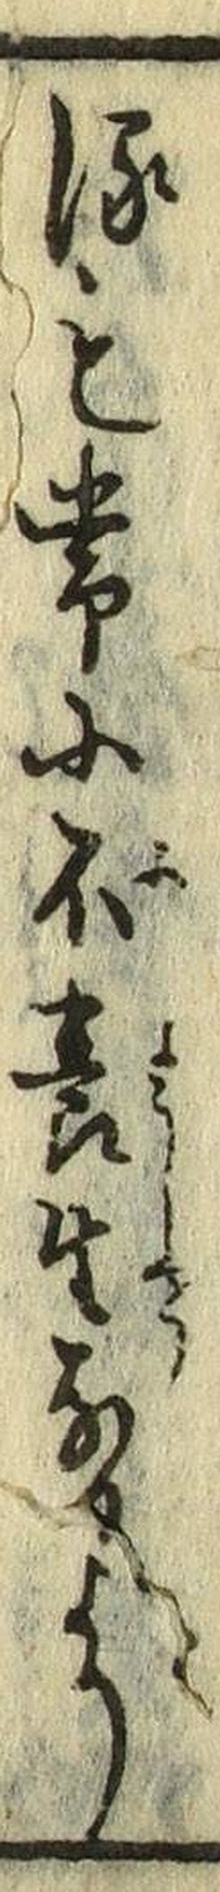るも常に不養生なるより
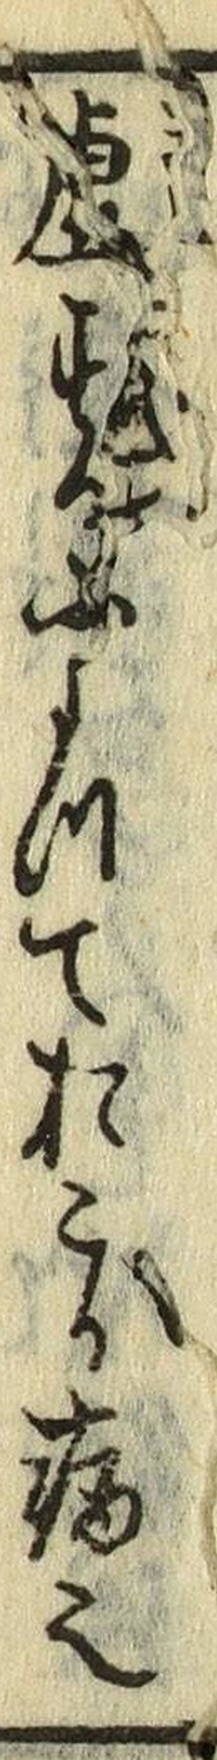虚するによつておこる病也
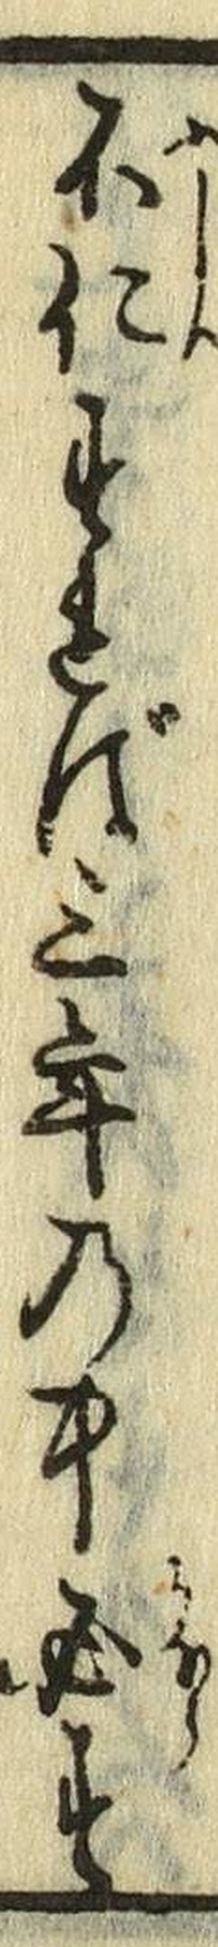不仁すれば三年の中必す
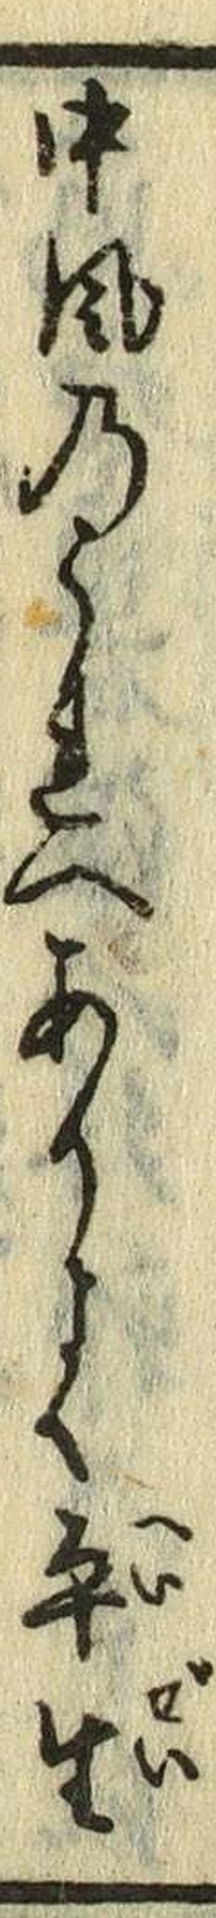中風のうれへありよく平生
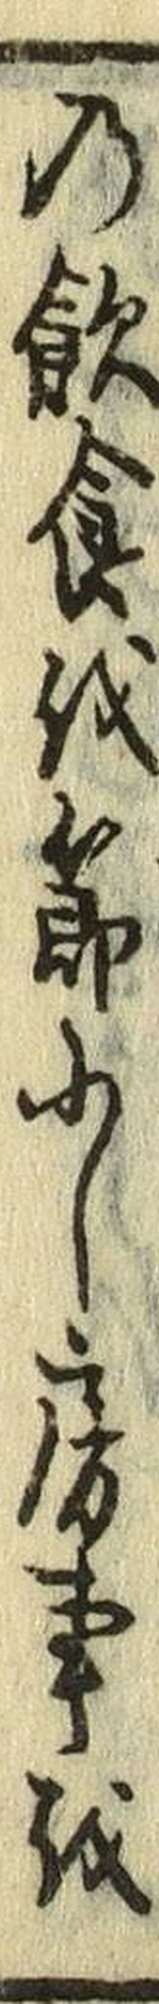の飲食を節にし房事を
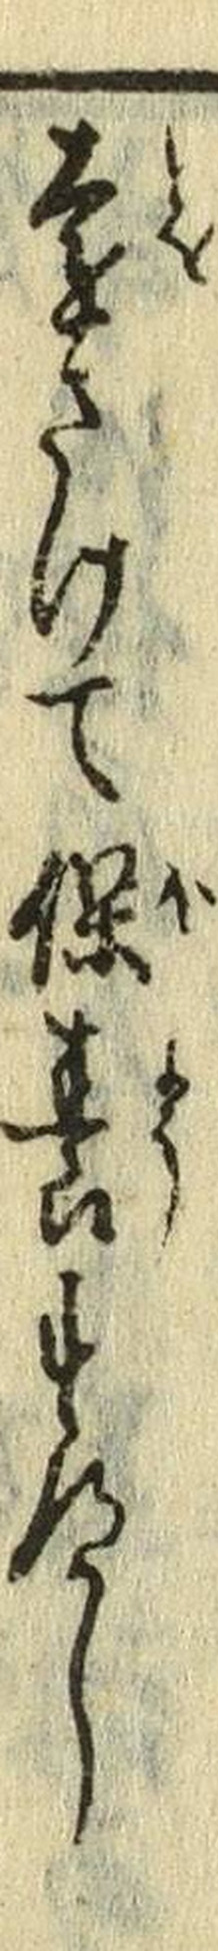遠さけて保養すへし
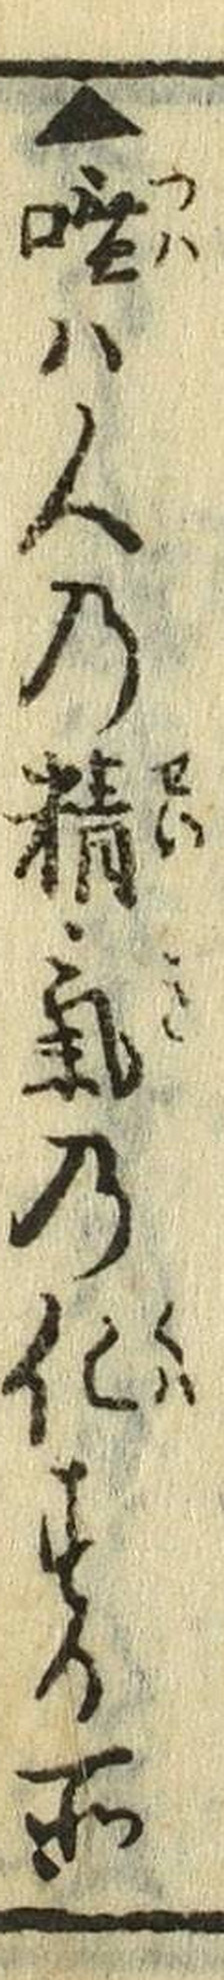▲唾は人の精気の化する所
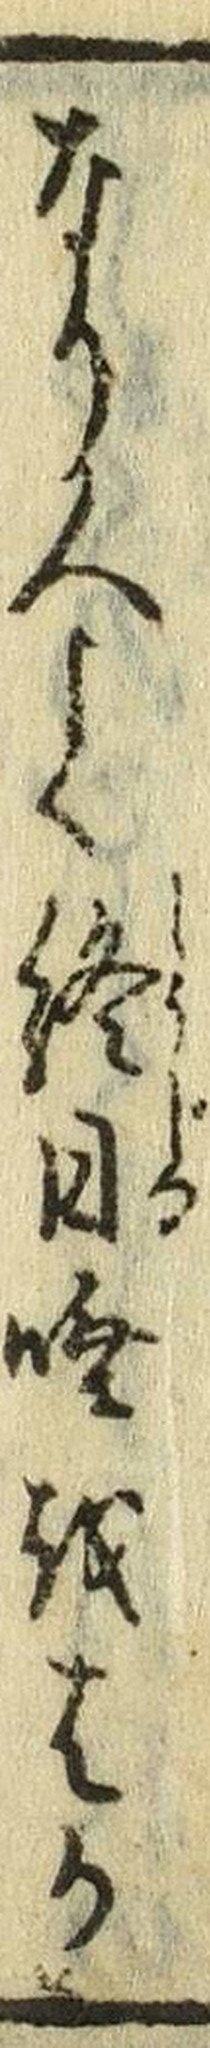なり久しく終日唾をはか
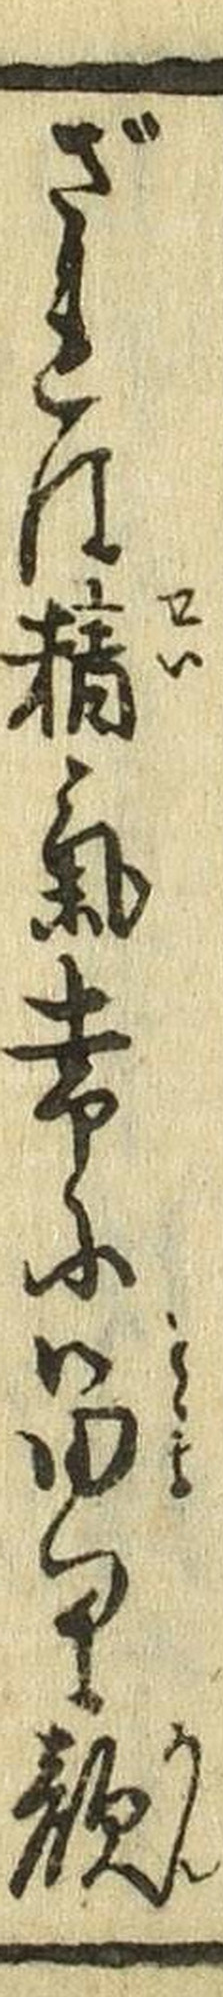ざれは精気常に留り顔
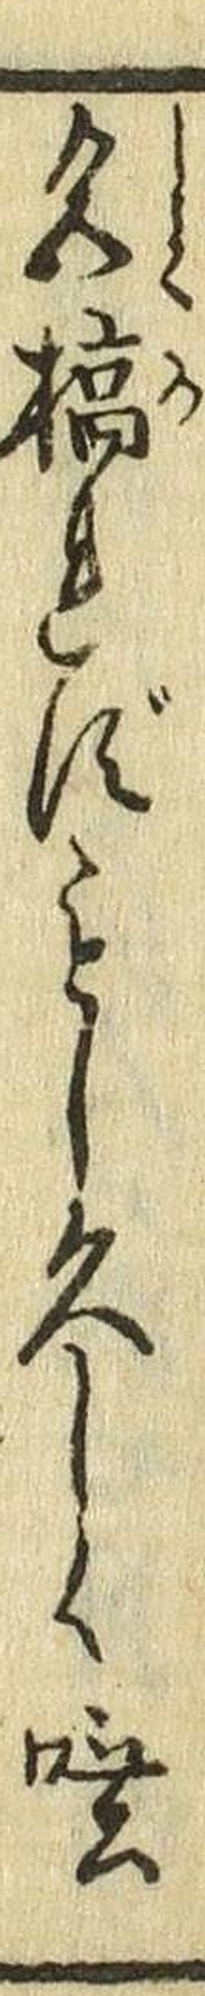色槁れずもし久しく唾
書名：居家養生記
